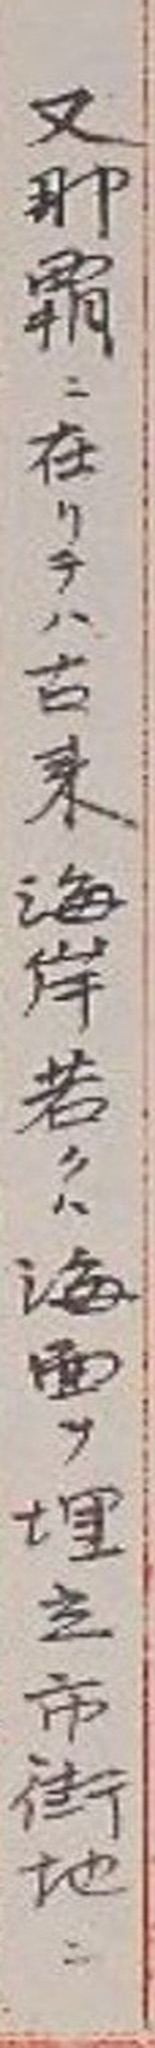又那覇ニ在リテハ古来海岸若クハ海面ヲ埋立市街地ニ
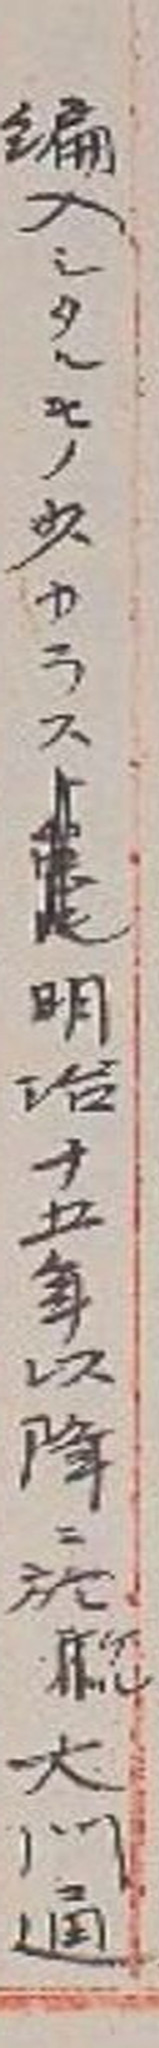編入シタルモノ少カラス明治十五年以降ニ於ケル大門通
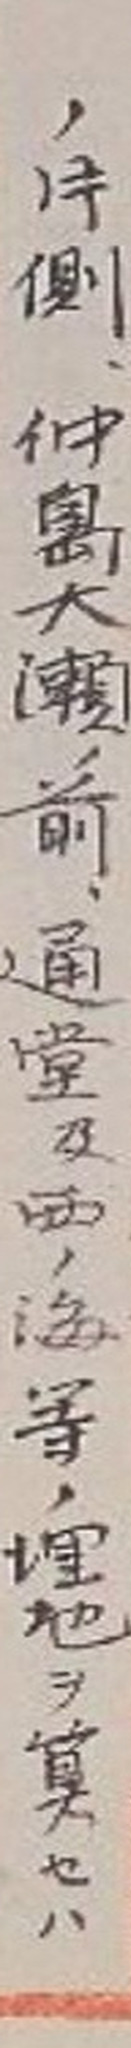ノ片側、仲島大瀬ノ前、通堂及西ノ海等ノ埋地ヲ算セハ
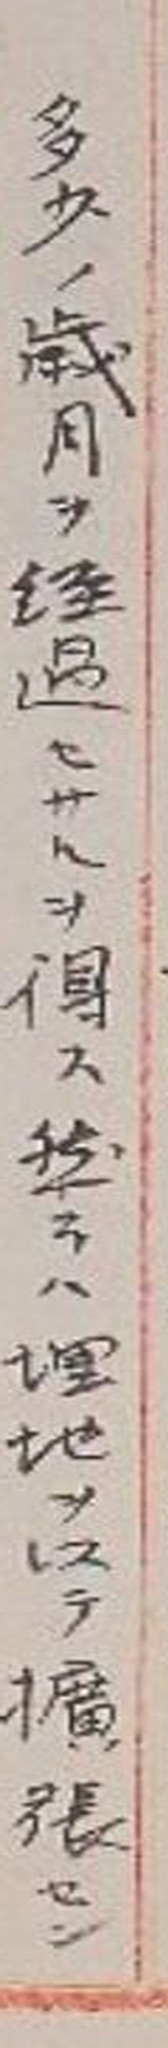多少ノ歳月ヲ経過セサルヲ得ス然ラハ埋地ヲ以テ拡張セン
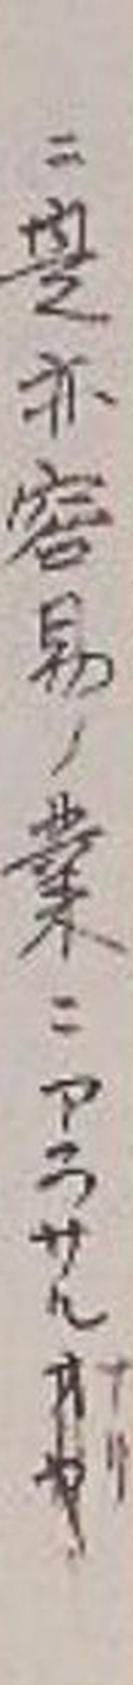ニ是亦容易ノ業ニアラサルナリ
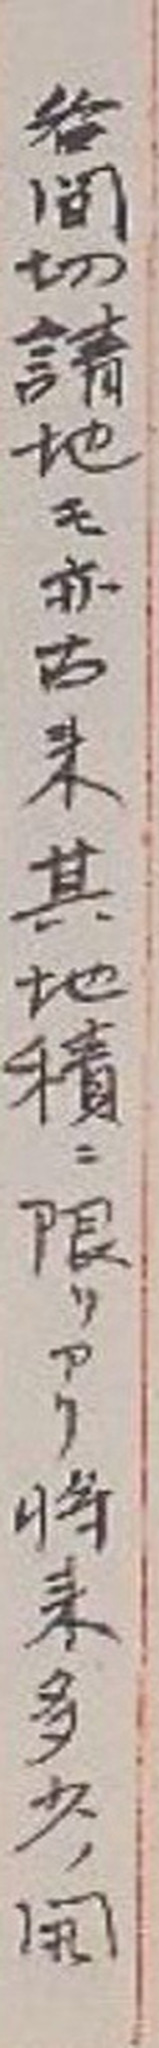各間切請地モ亦古来其地積ニ限リアリ将来多少ノ開
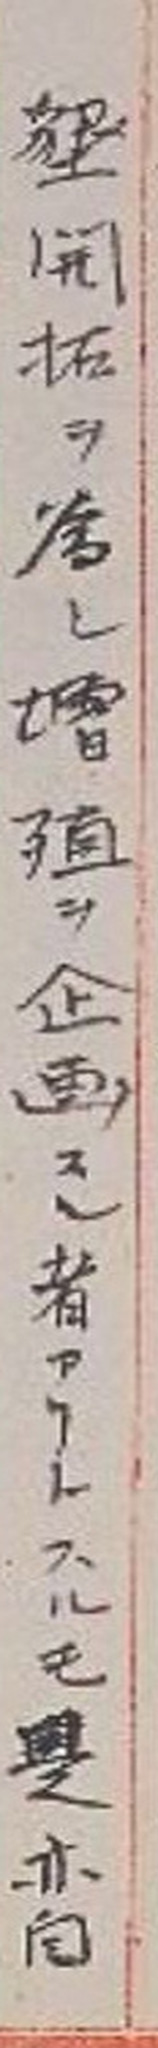墾開拓ヲ為シ増殖ヲ企画スル者アリトスルモ是亦自
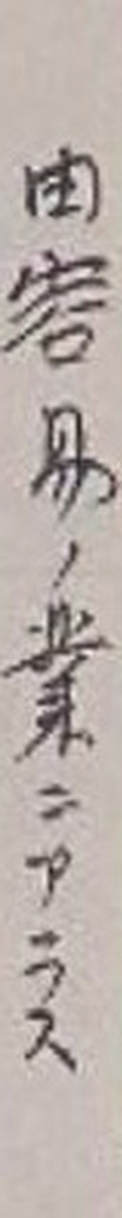由容易ノ業ニアラス
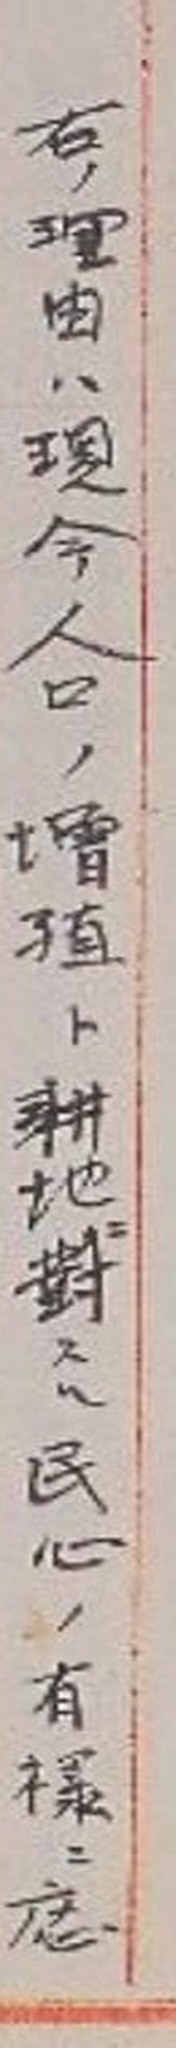右ノ理由ハ現今人口ノ増殖ト耕地ニ対スル民心ノ有様ニ応
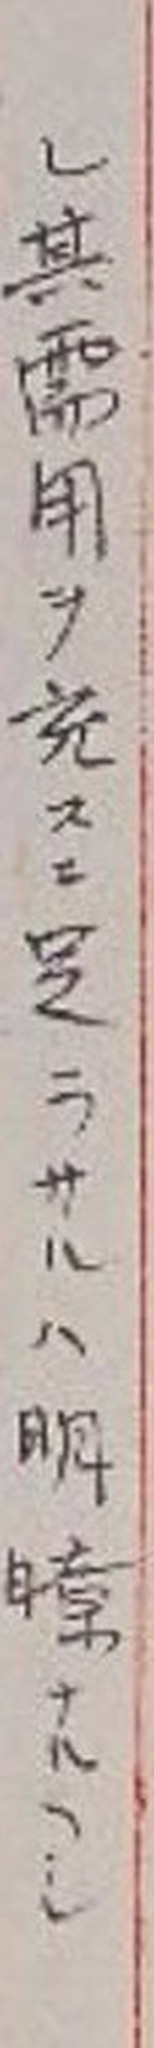シ其需用ヲ充スニ足ラサルハ明瞭ナルヘシ
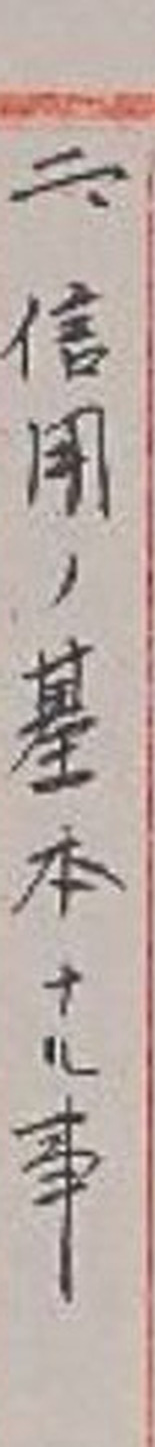二、信用ノ基本ナル事

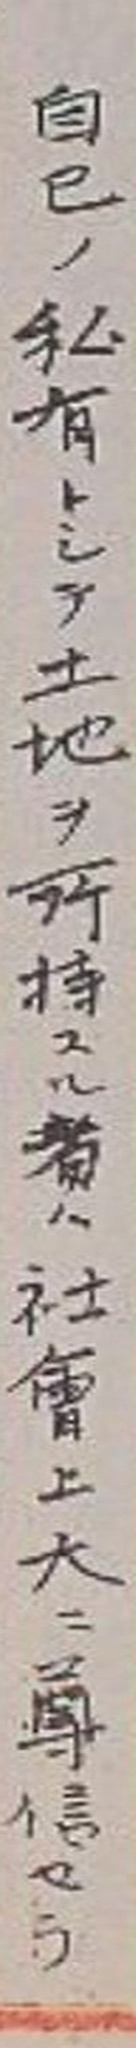自己ノ私有トシテ土地ヲ所持スル者ハ社会上大ニ尊信セラ
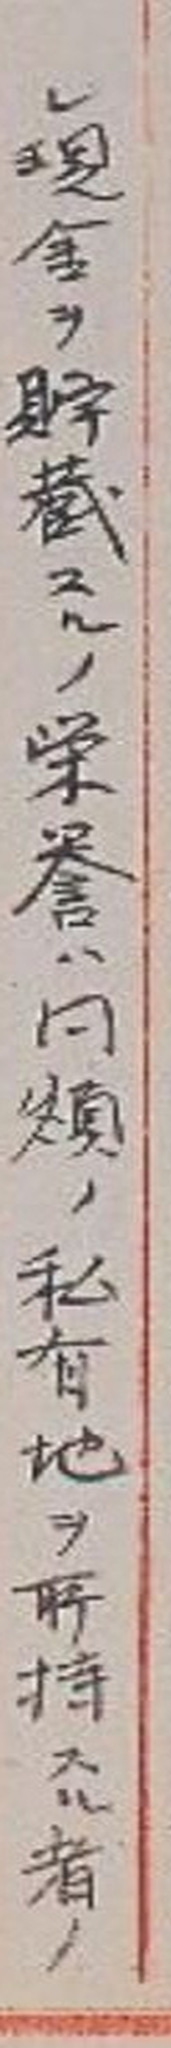レ現金ヲ貯蔵スルノ栄誉ハ同額ノ私有地ヲ所持スル者ノ
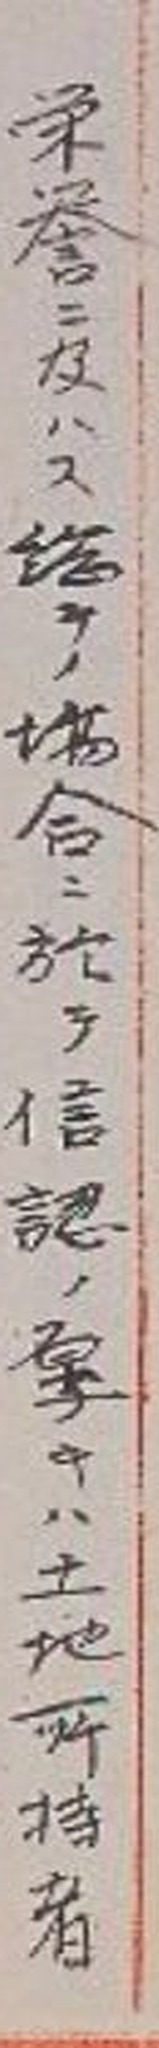栄誉ニ及ハス総テノ場合ニ於テ信認ノ厚キハ土地所持者
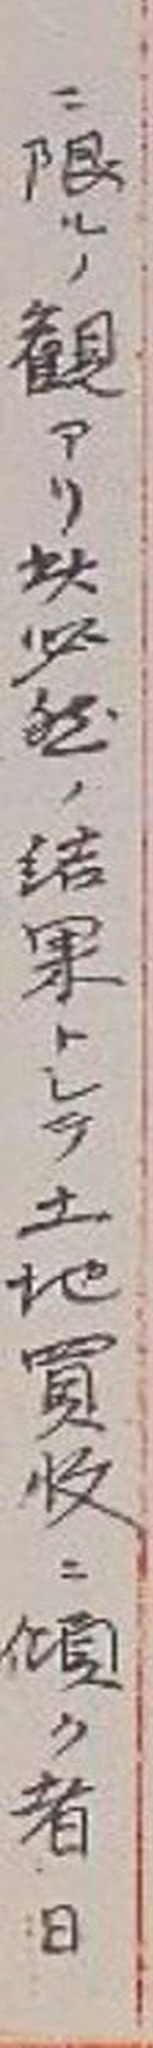ニ限ルノ観アリ此必然ノ結果トシテ土地買収ニ傾ク者日
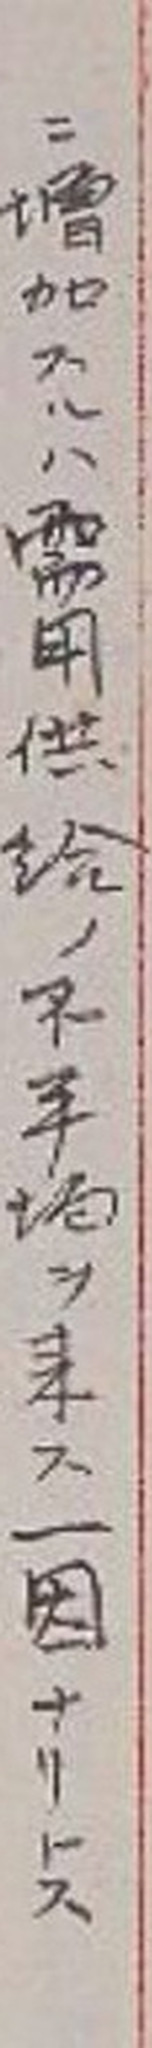ニ増加スルハ需用供給ノ不平均ヲ来ス一因ナリトス
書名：本県地価ノ高キ理由調書
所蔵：University of the Ryukyus Library
